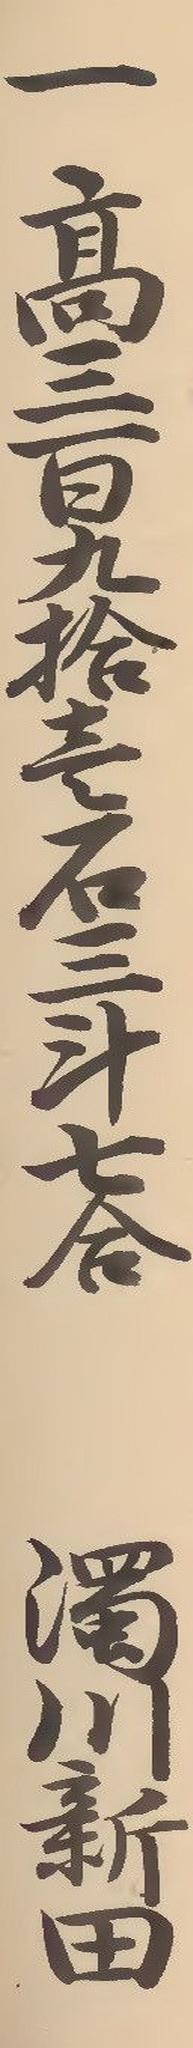一高三百九拾壱石三斗七合濁川新田
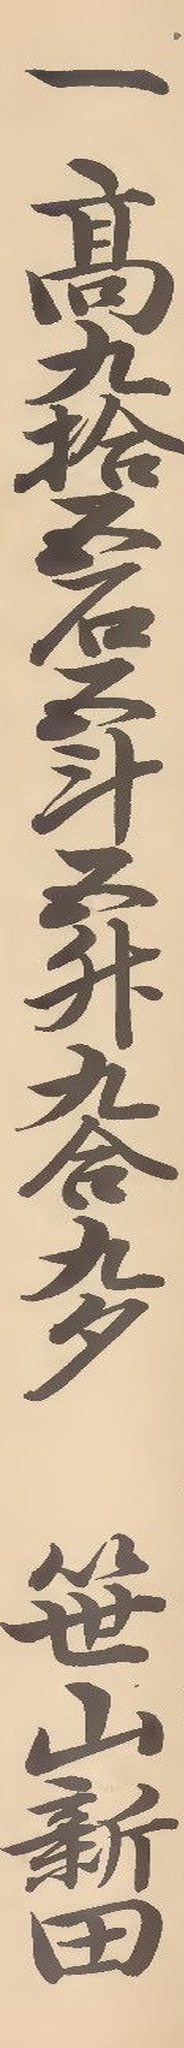一高九拾五石五斗五升九合九勺笹山新田
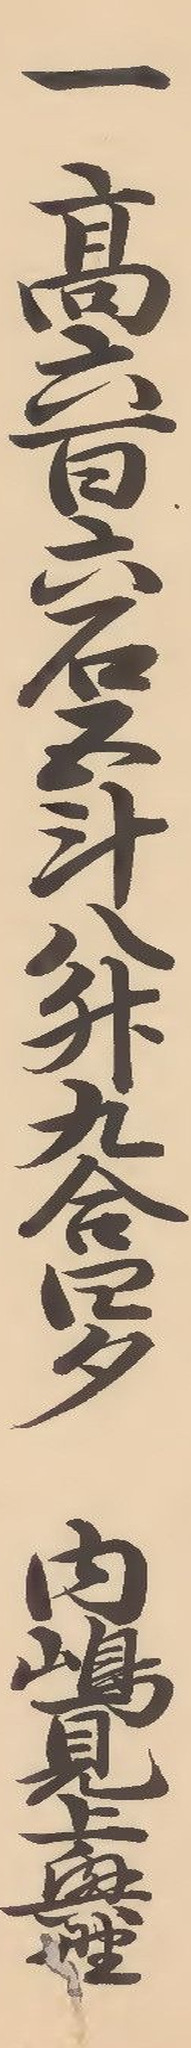一高六百六石五斗八升九合四勺内島見上興野
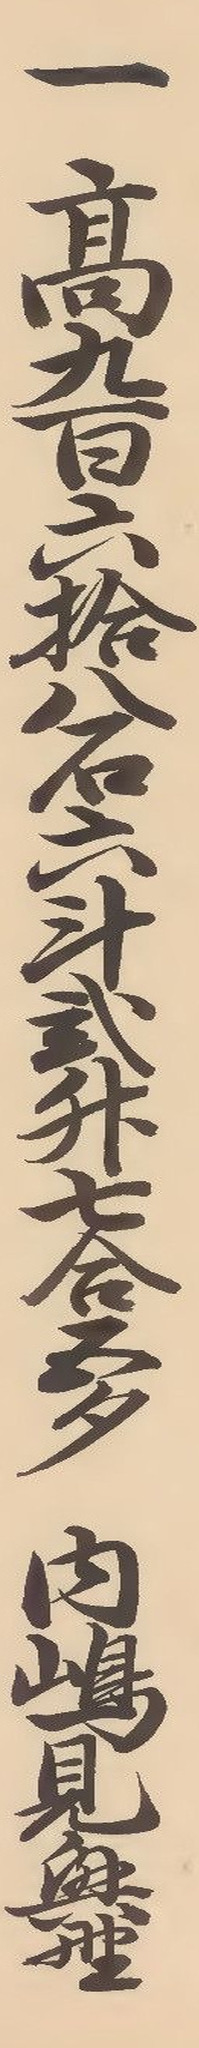一高九百六拾八石六斗弐升七合五勺内島見興野
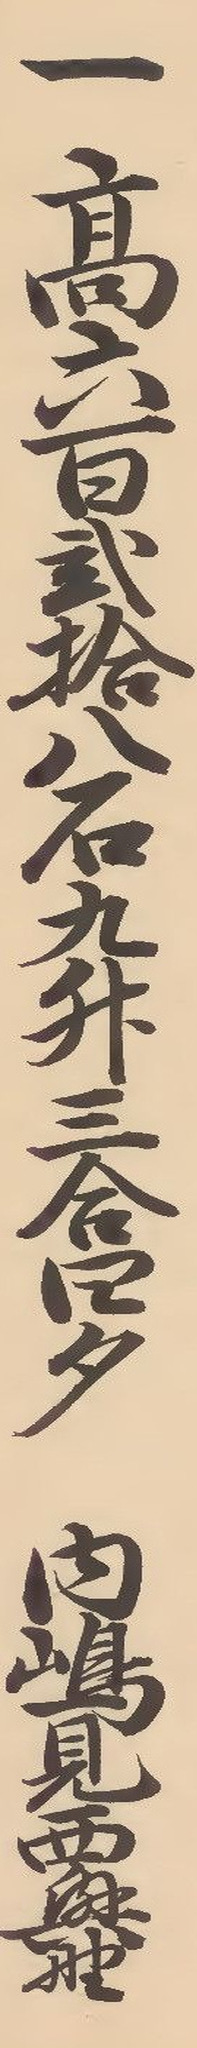一高六百弐拾八石九升三合四勺内島見西興野

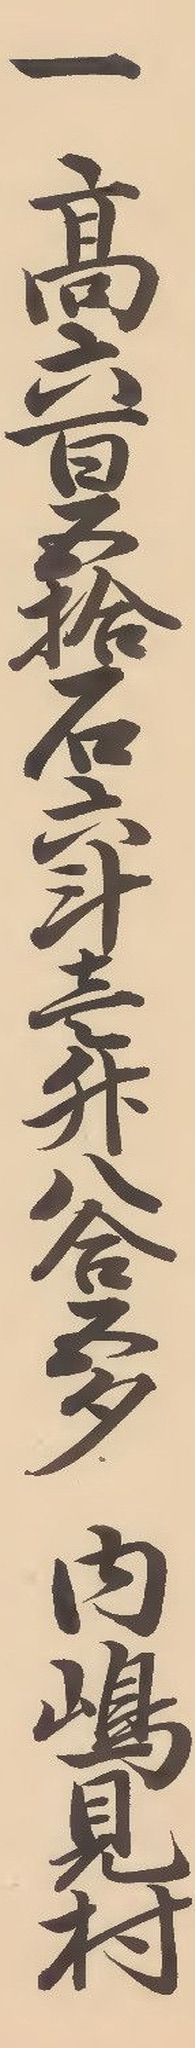一高六百五拾石六斗壱升八合五勺内島見村
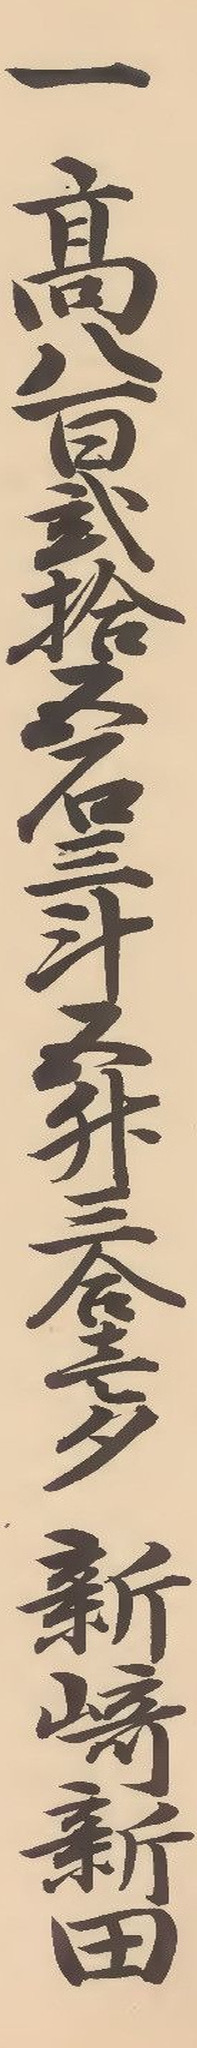一高八百弐拾五石三斗五升三合壱勺新崎新田
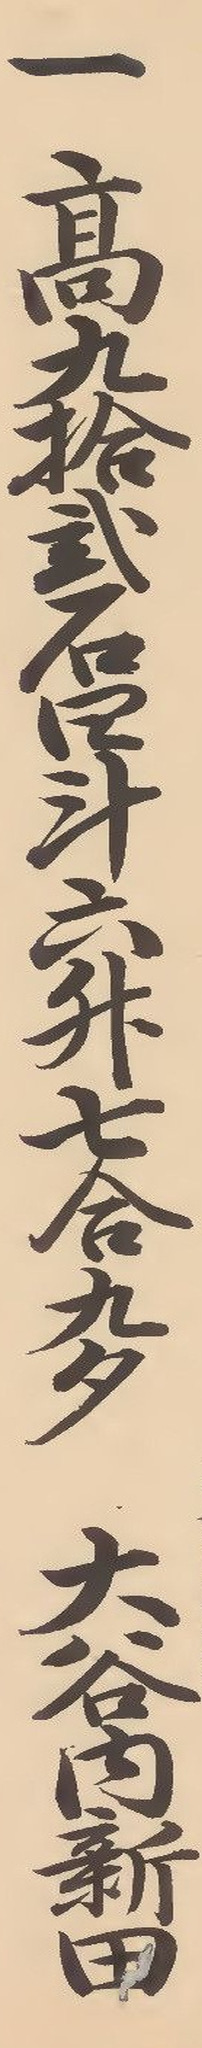一高九拾弐石四斗六升七合九勺大谷内新田
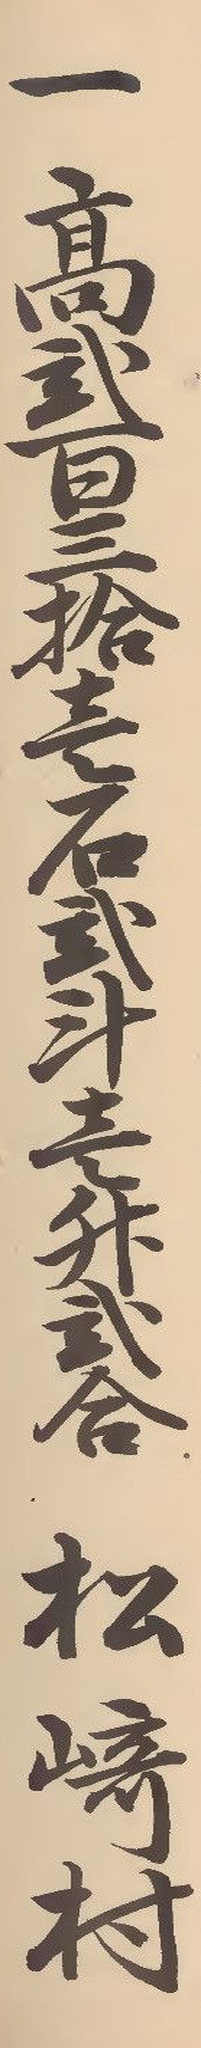一高弐百三拾壱石弐斗壱升弐合松崎村
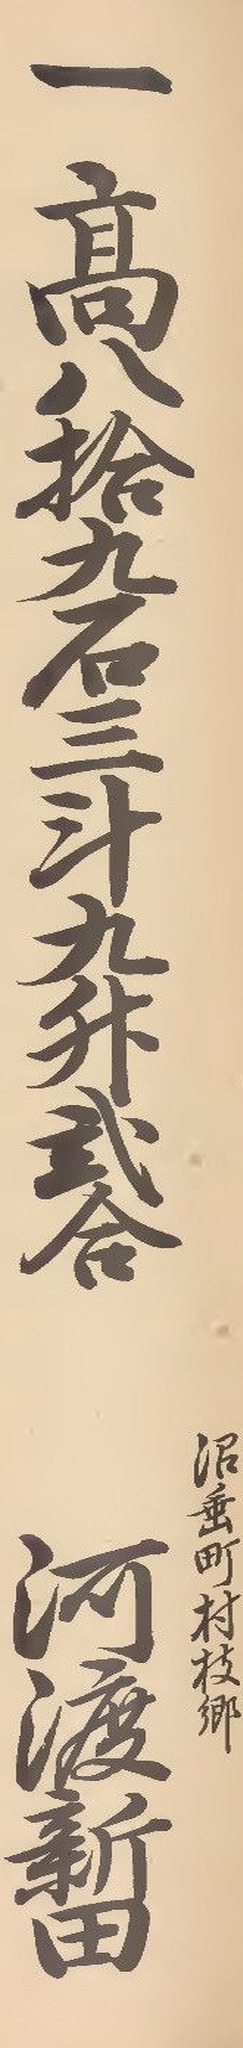一高八拾九石三斗九升弐合河渡新田
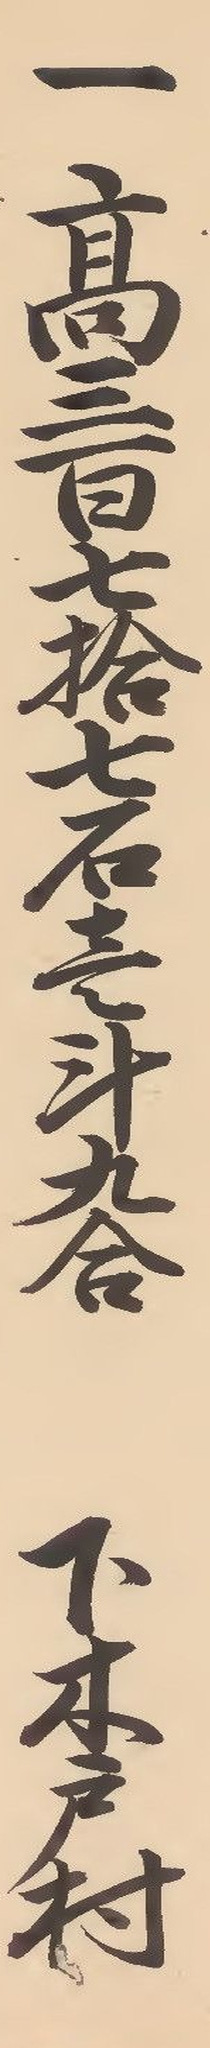一高三百七拾七石壱斗九合下木戸村
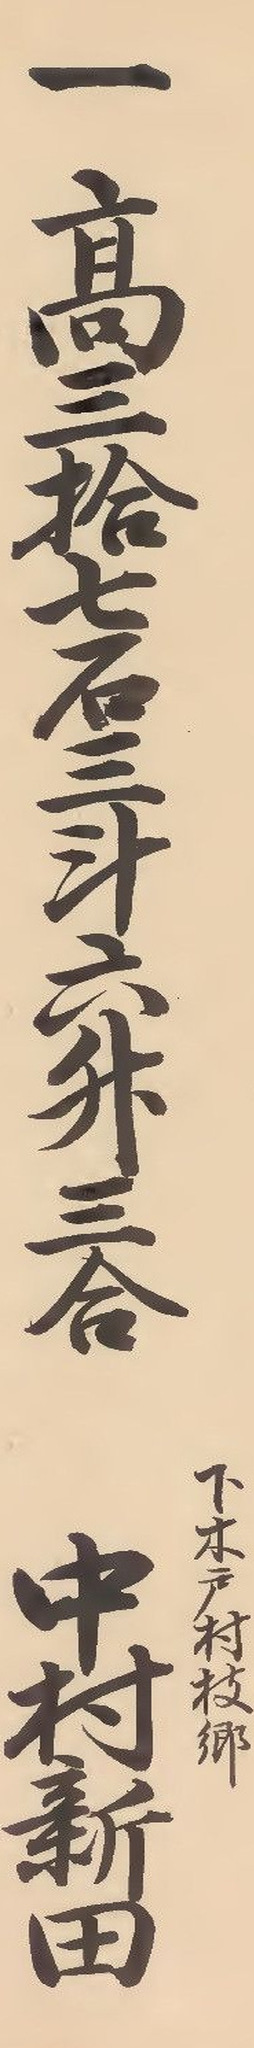一高三拾七石三斗六升三合中村新田
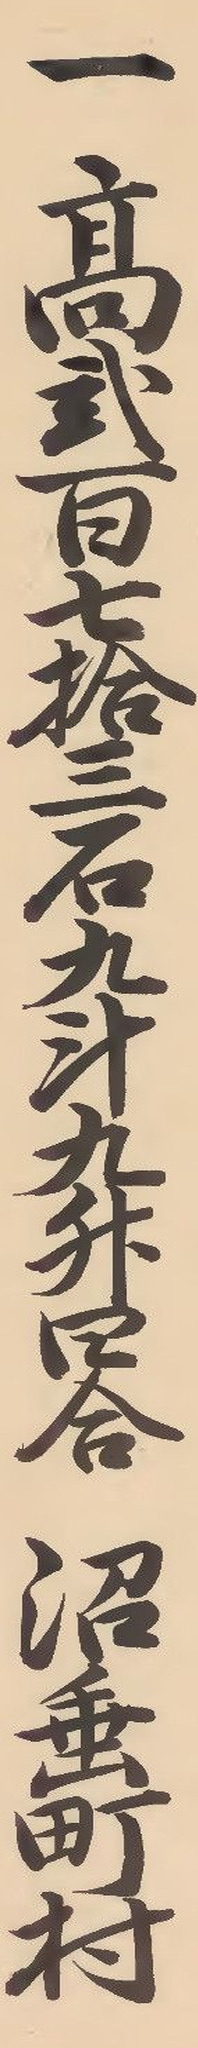一高弐百七拾三石九斗九升四合沼垂町村

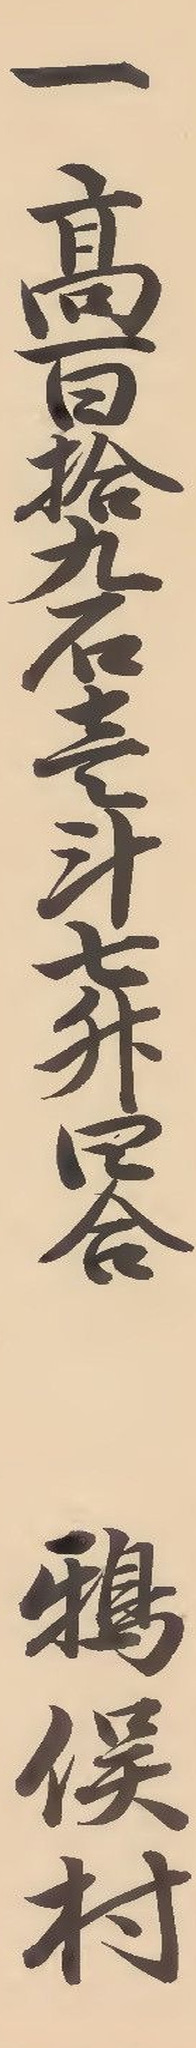一高百拾九石壱斗七升四合鴉俣村
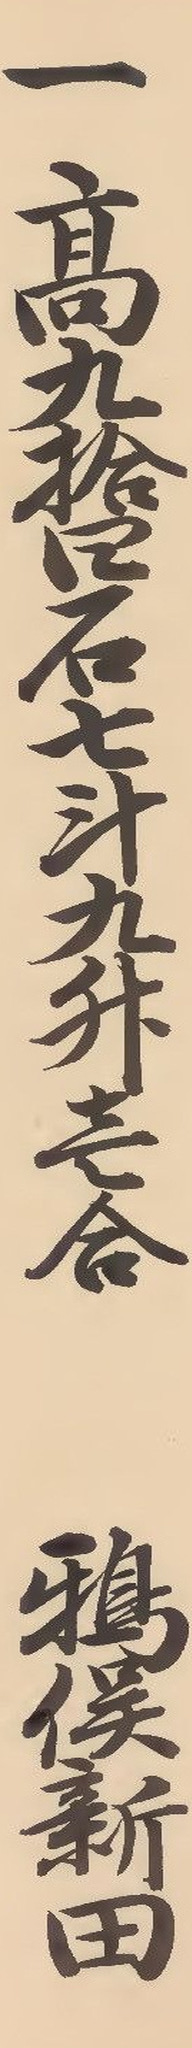一高九拾四石七斗九升壱合鴉俣新田
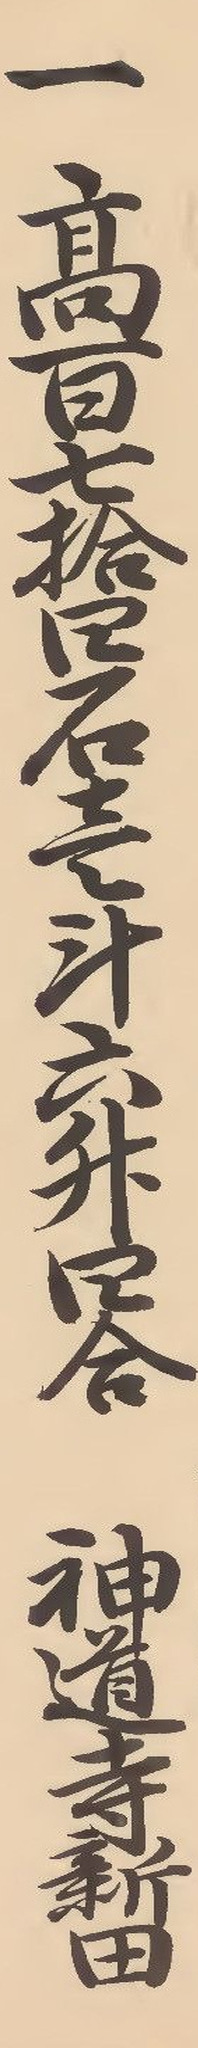一高百七拾四石壱斗六升四合神道寺新田
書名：越後国郷帳　下
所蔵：国立公文書館 National Archives of Japan
